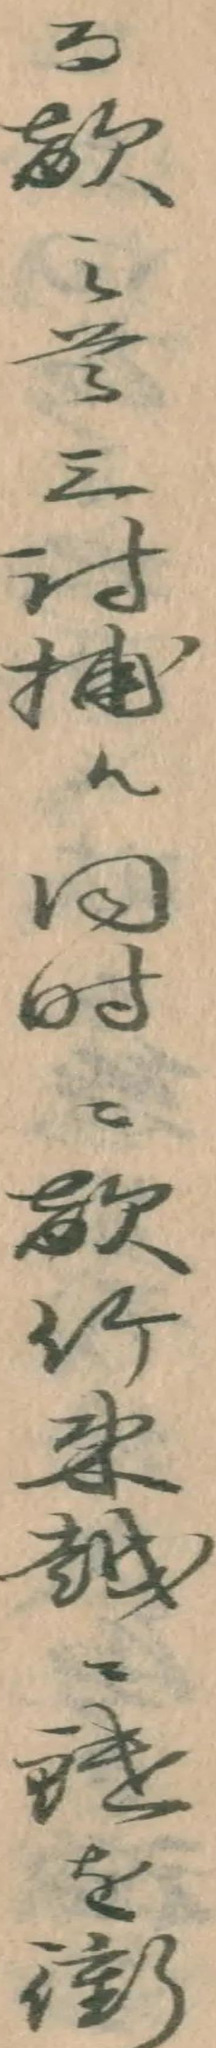る敵之首三討捕る同時に敵竹束越に鑓を衛
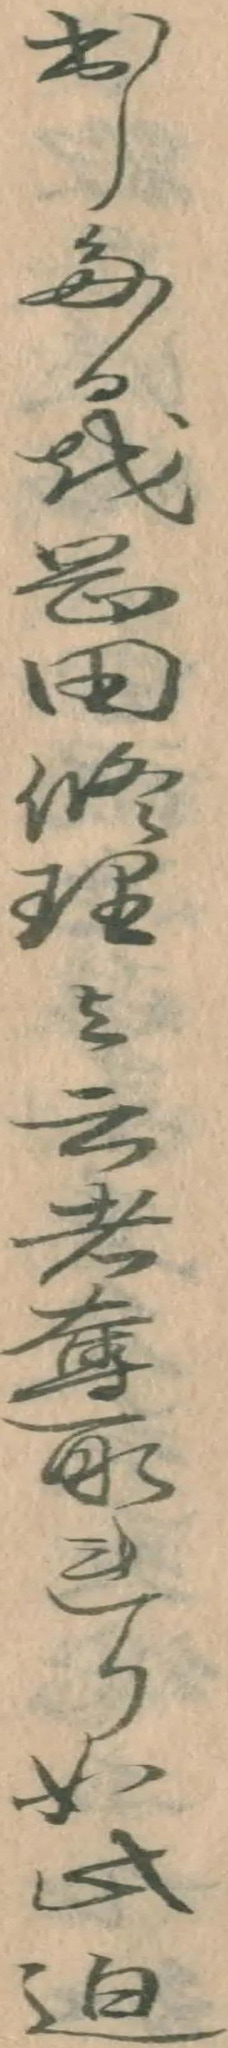出し多る越岡田修理与云者奪取連り如此迫
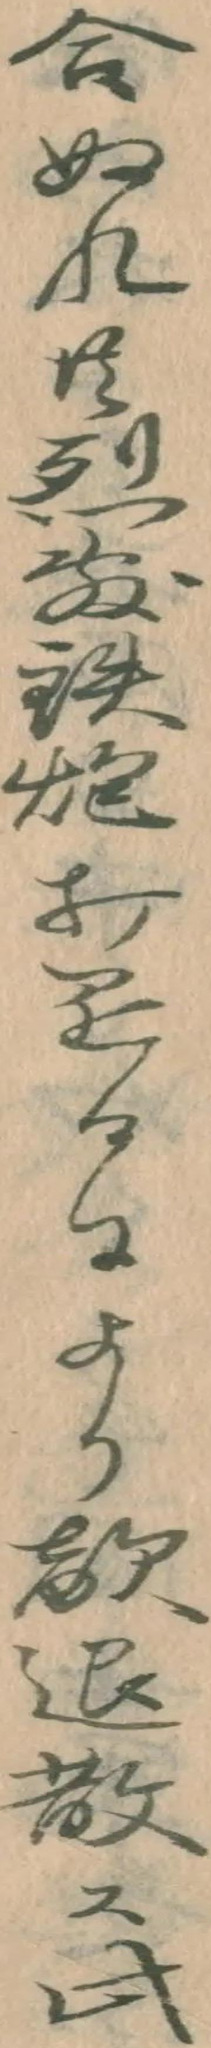合ぬれ共烈敷鉄炮打懸る尓より敵退散す此
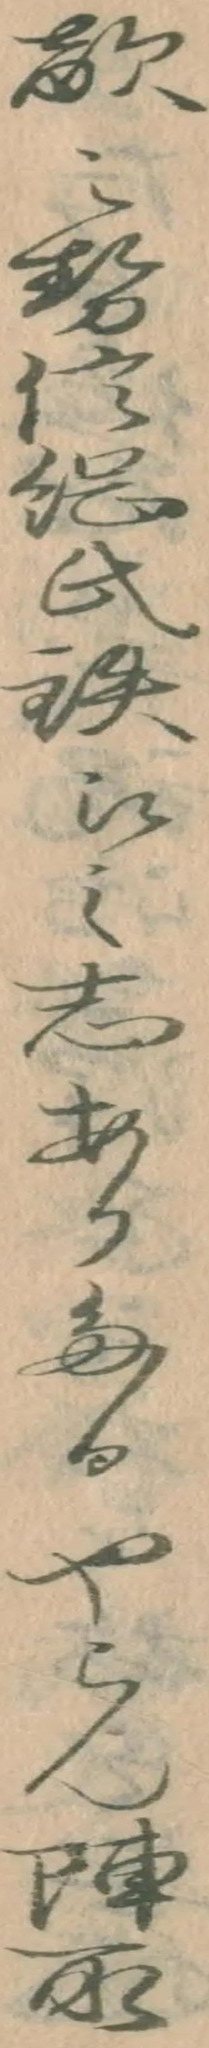敵之勢信綱氏鉄江之志あり多るやらん陣取
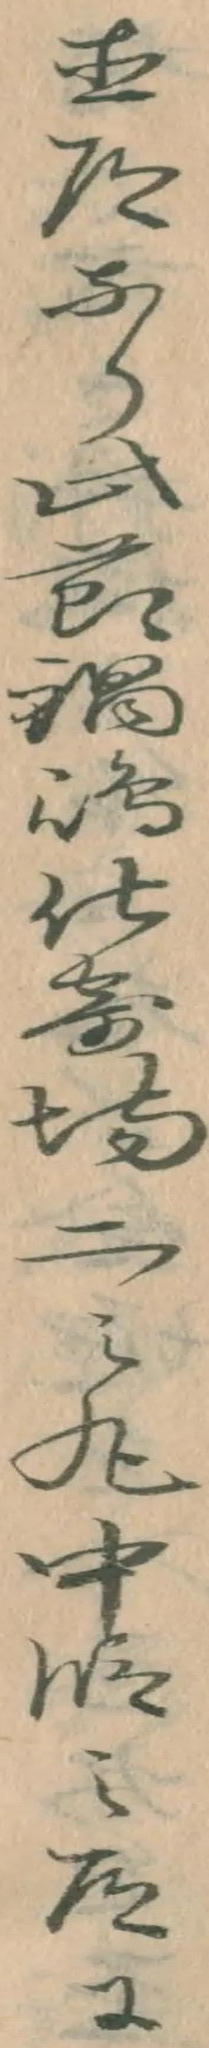直道なり此節鍋島仕寄場二之丸中段之道干

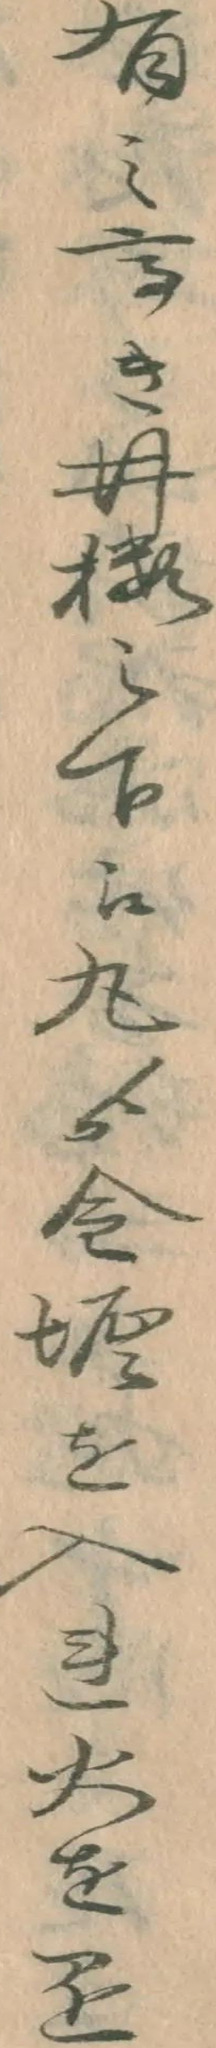有之高き井桜之下江丸ゟ金堀を入連火を懸
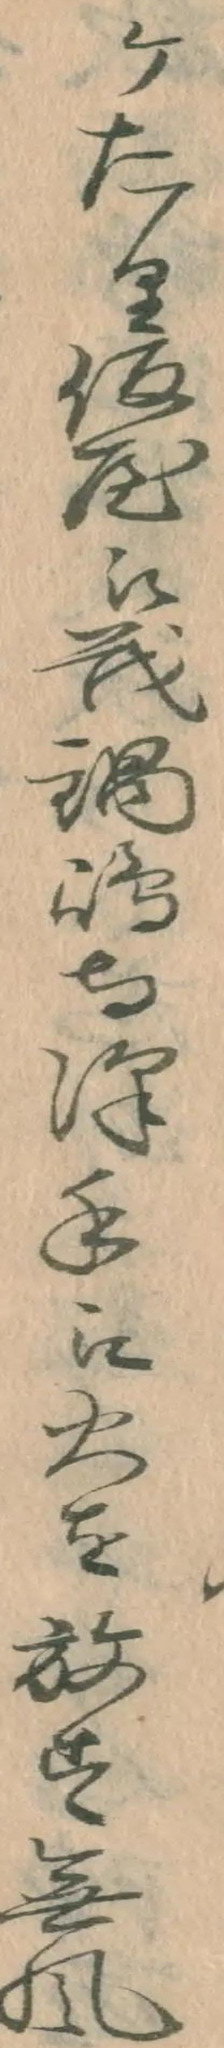けた里仮屋江茂鍋島寺沢手江火を放春無風
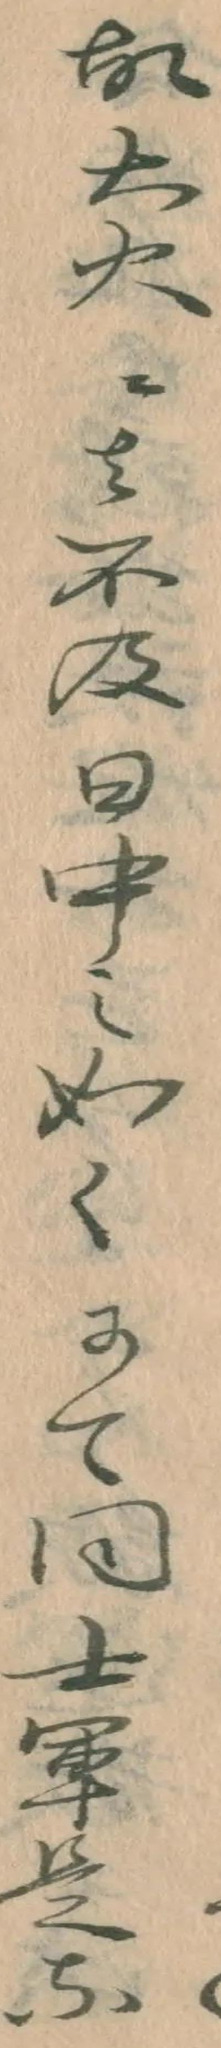故大火に者不及日中之如く尓て同士軍是な
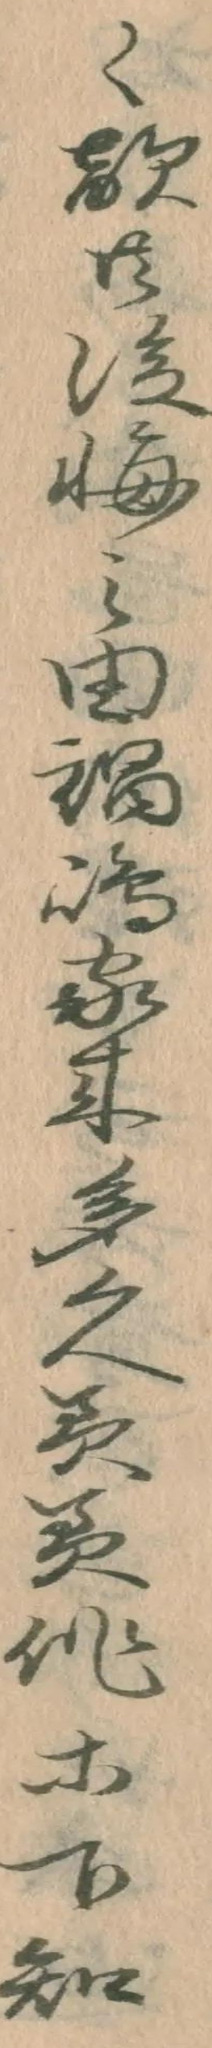く敵共後悔之由鍋島家来多久美美作等下知
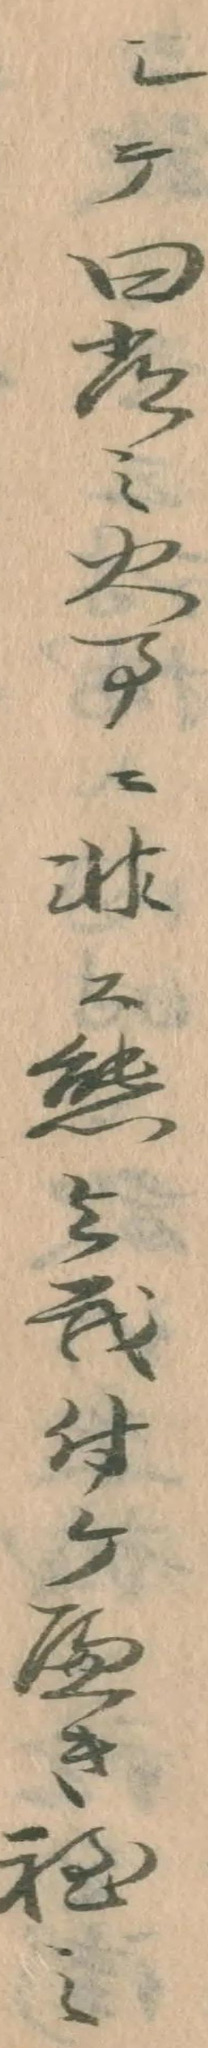して曰常之火事に非す熊与茂付け扁き程之
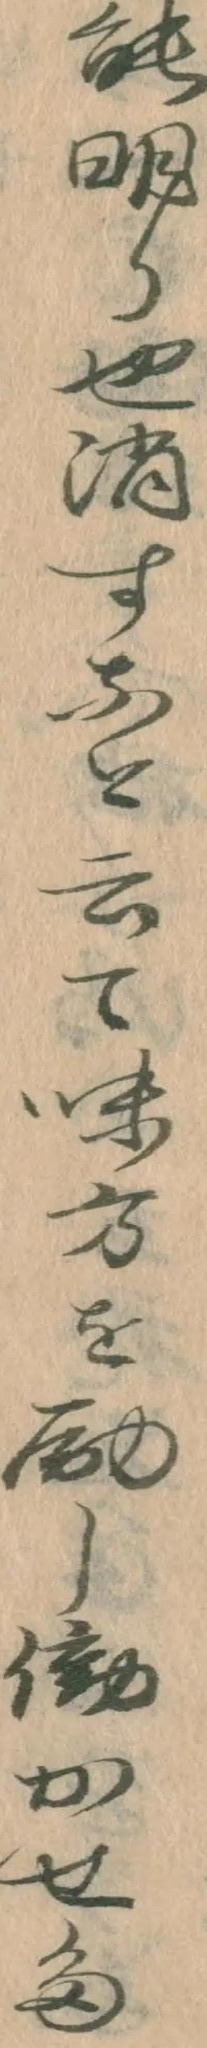能明り也消すなと云て味方を励し働かせ多
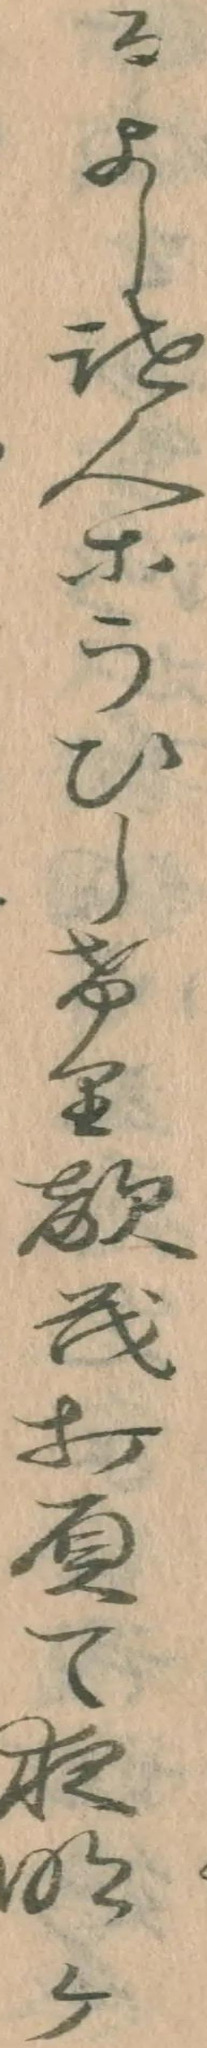るよし諸人等うひし希里敵茂打負て夜明け
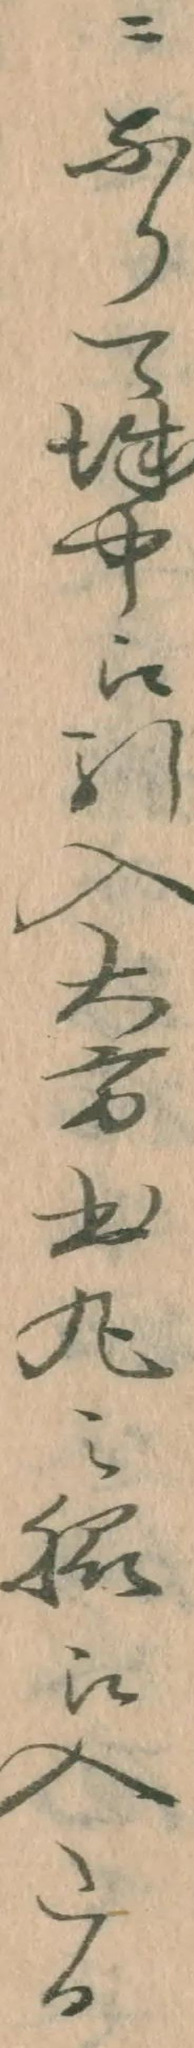になりて城中江引入大方出丸之脇江入たる
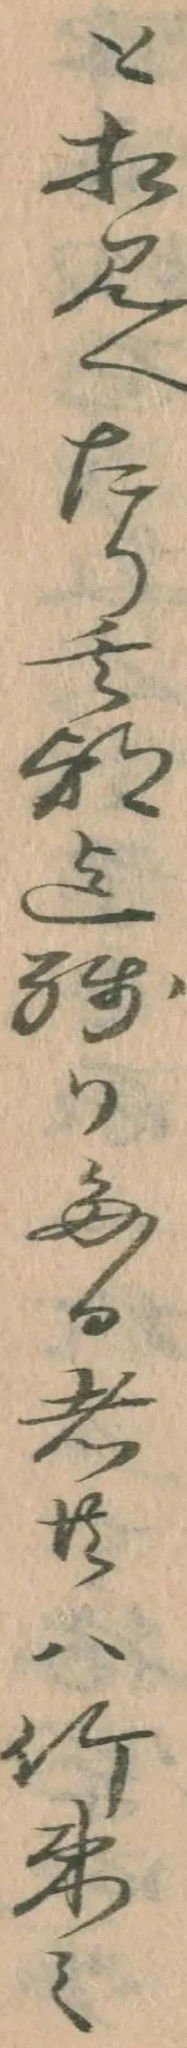と相見へたり其朝迄残り多る者共は竹束之
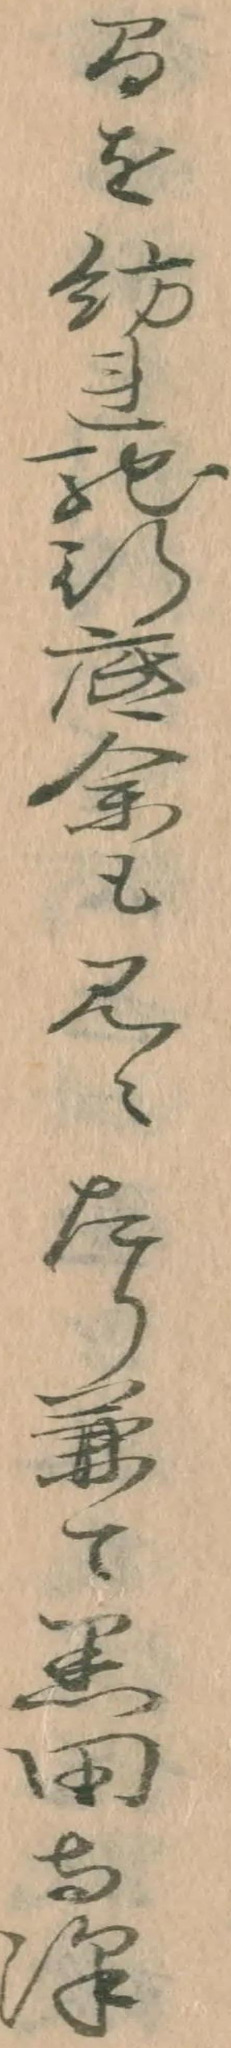間を紡連馳行底余も見にたり兼て黒田寺沢
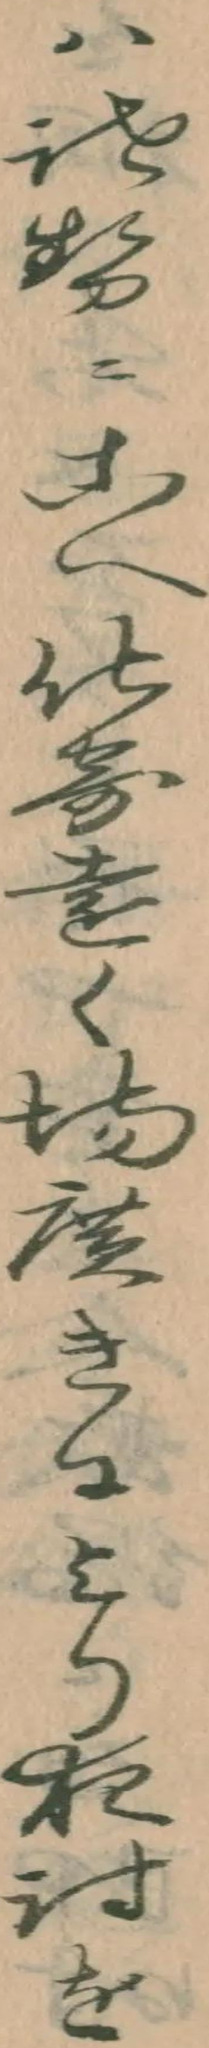は諸勢に古へ仕寄遠く場広き尓与り夜討を
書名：切支丹御退治記 49巻. [7]
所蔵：国立国会図書館 National Diet Library, JAPAN
